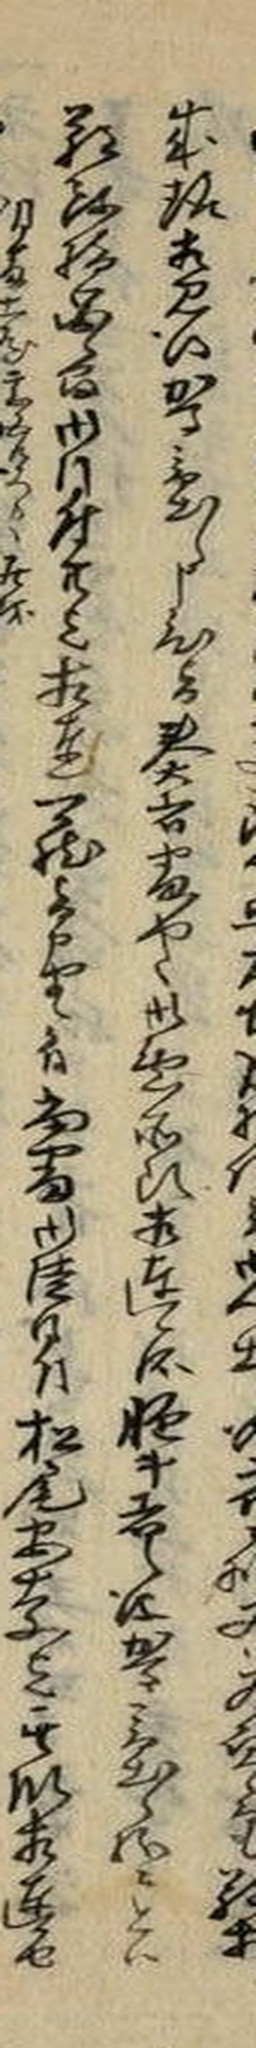難致指図候間御目付共迄相達可然旨申聞候に付当番御徒目付松尾安太夫迄其段相達候由
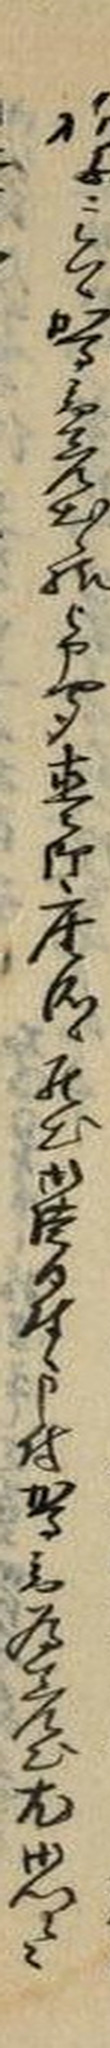様子に候はゝ駕に而差出候様被申聞直々御座所へ罷出御徒目付へ申付駕に而為差出尤御門々々
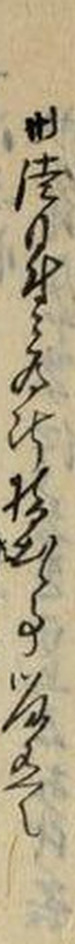御徒目付に為断指出候事留有之
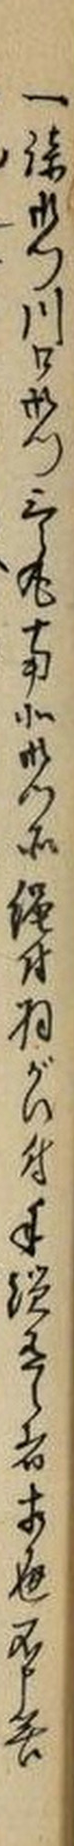一漆御門川口御門三之丸南北御門所縄付羽がい付手鎖有之者相通不申筈
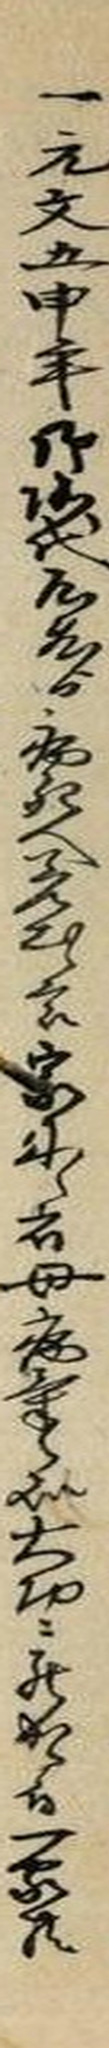一元文五申年御城代屋敷ゟ病死人差出候節家来之者母病気候処大切に罷成候付一家共
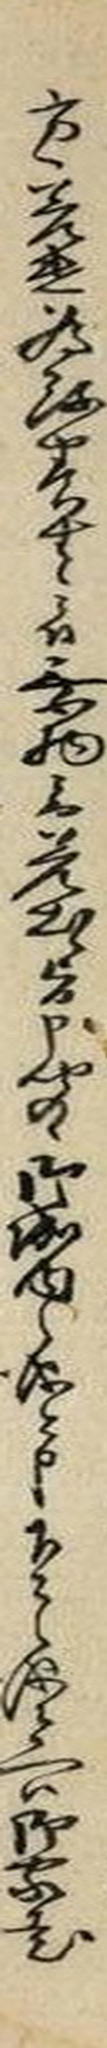方へ差遣為致養生候に付乗物に而差出候旨申聞候御城内之儀と申下々儀に候へは御家老
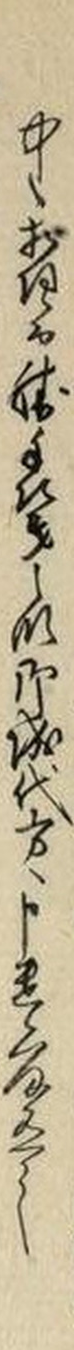中へ相伺候而勝手次第之段御城代方申遣候留有之
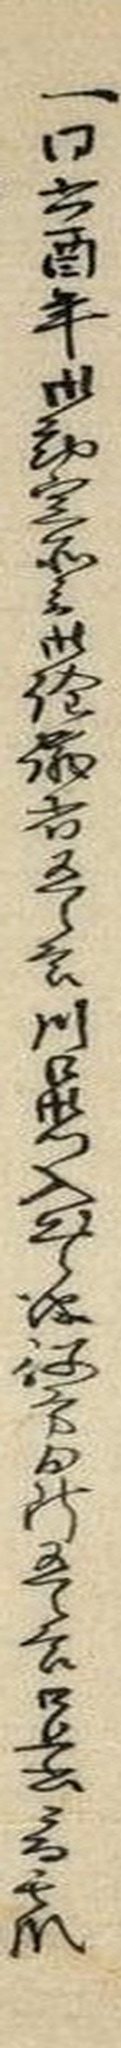一同六酉年御勘定所に而御詮議者有之節川口御門入出之儀役方ゟ断有之候節口上書に而其段
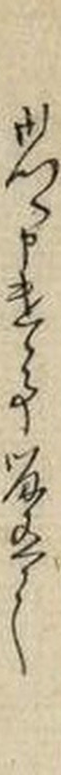御門へ申遣候事留有之
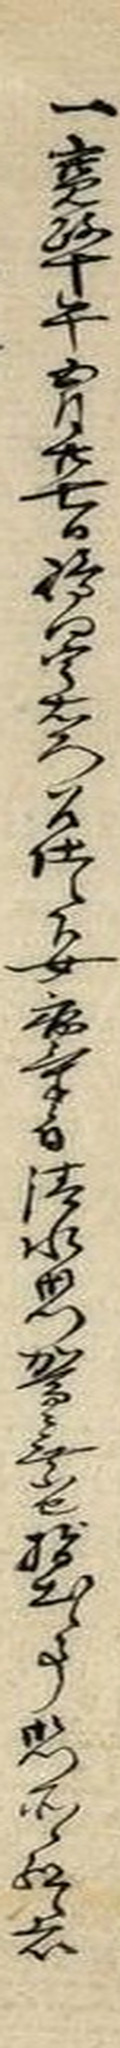一寛政十午五月廿七日嶋田宇右衛門召仕候下女病気に付清水御門駕に乗せ指出候事御門所へ組之者
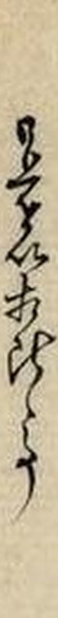口上を以相断候事
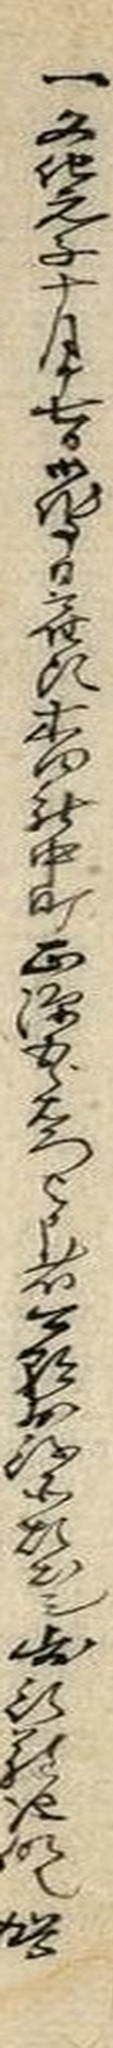一文化元子十月七日御作事日雇頭木田新中町正源五郎右衛門と申者今朝於役所煩出シ歩行難儀仍之駕
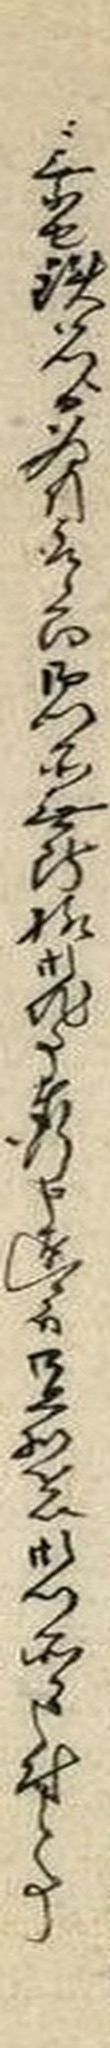に乗せ鉄御門ゟ為引取候間御門所無断候様御作事奉行申達候付口上扣を以御門所へ申付候事
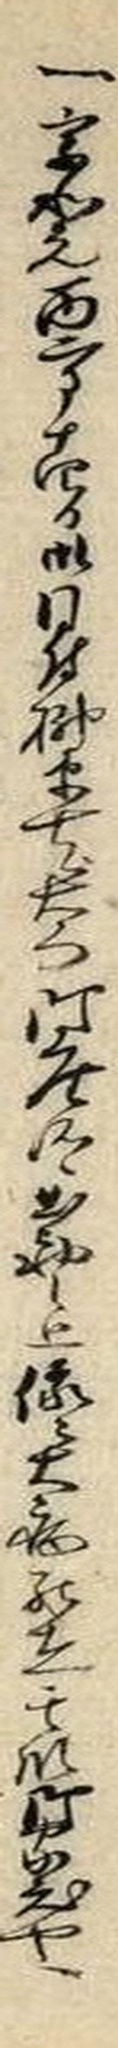一享和元酉二月十四日御目付榊原十郎右衛門御座所へ出勤之上俄に大病罷在其段御家老中へ
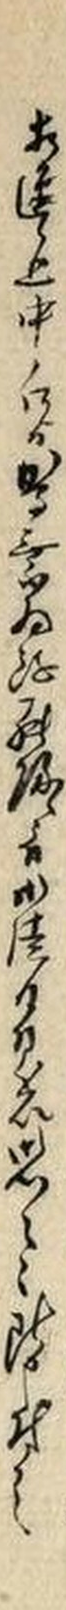相達候上中ノ口ゟ駕乗為致罷帰候に付御徒目付を以御門々々断申付之
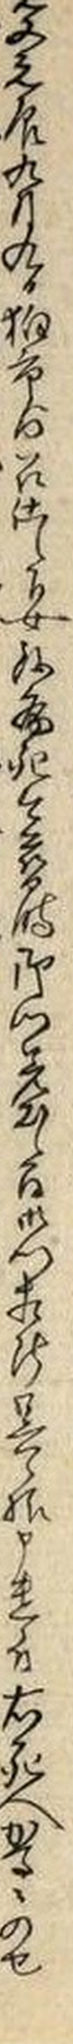一元文元辰九月九日狛市右衛門召仕候下女致病死今暮時御門差出候間御門相断呉候様申遣候付右死人駕へのせ
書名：御門御櫓之部
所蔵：福井県文書館 Fukui Prefectural Archives
